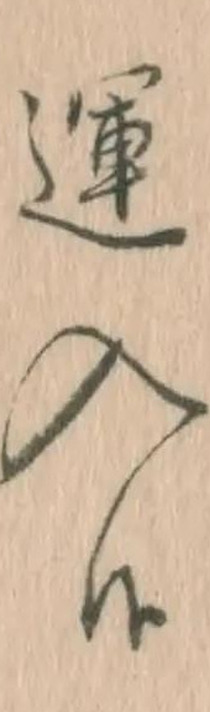運入候
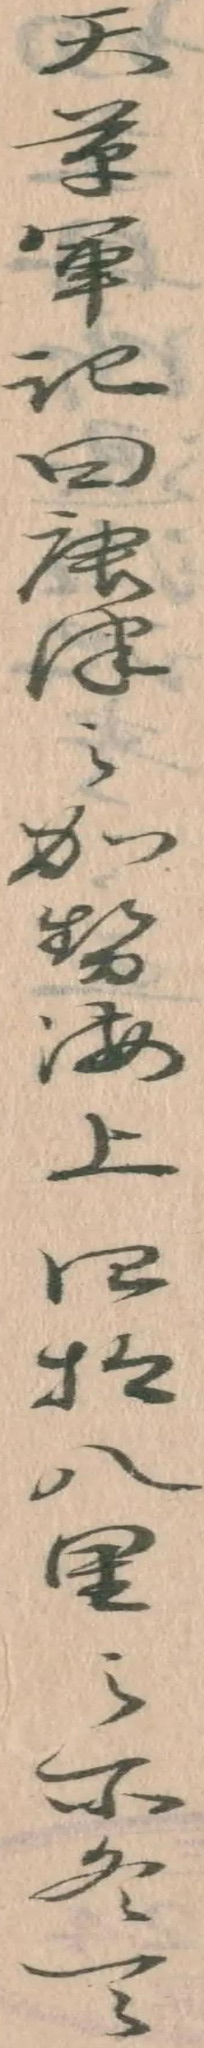天草軍記曰唐津之加勢海上四拾八里之所冬天
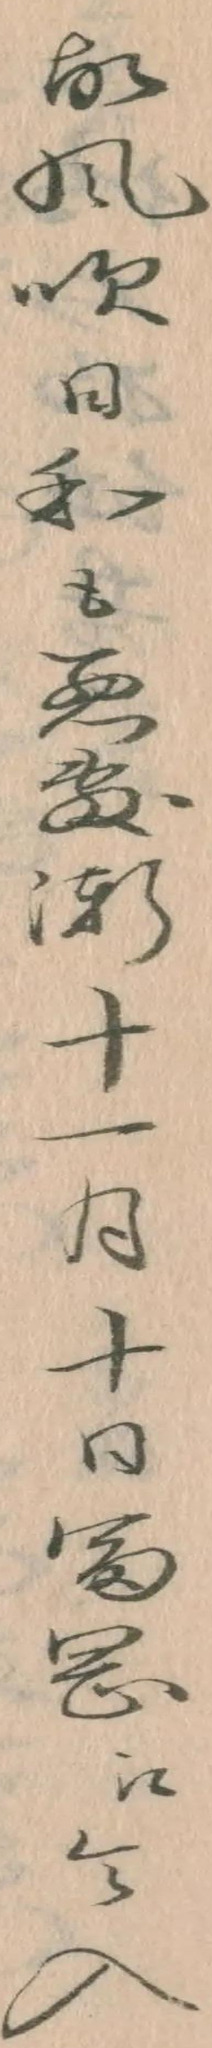故風吹日和も悪敷漸十一月十日冨岡江令入
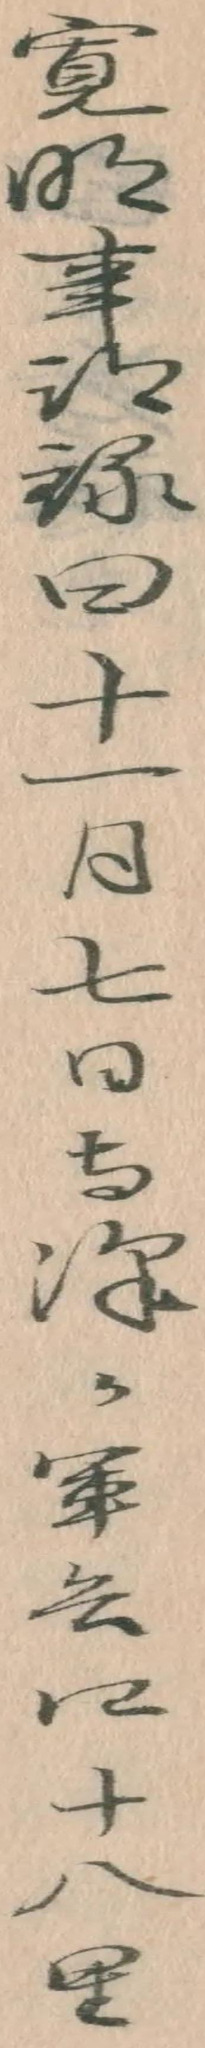寛明事跡録曰十一月七日寺沢か軍兵四十八里
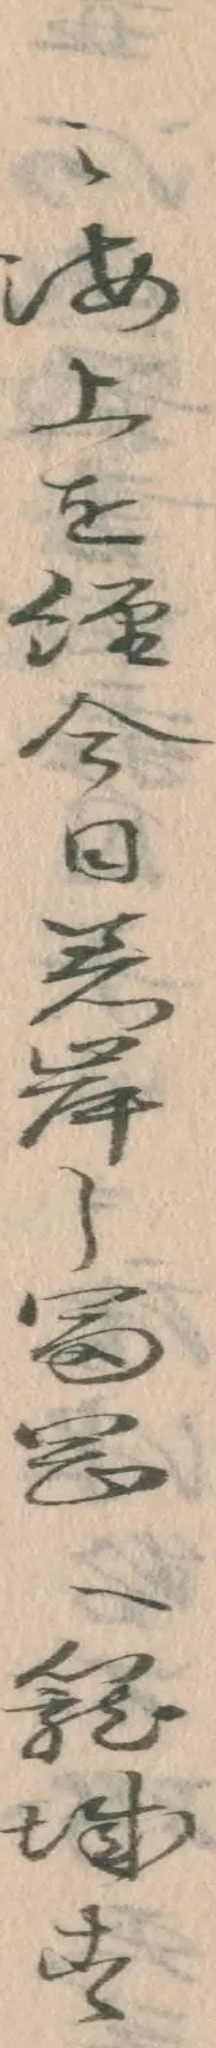之海上を経今日着岸し冨岡へ籠城春
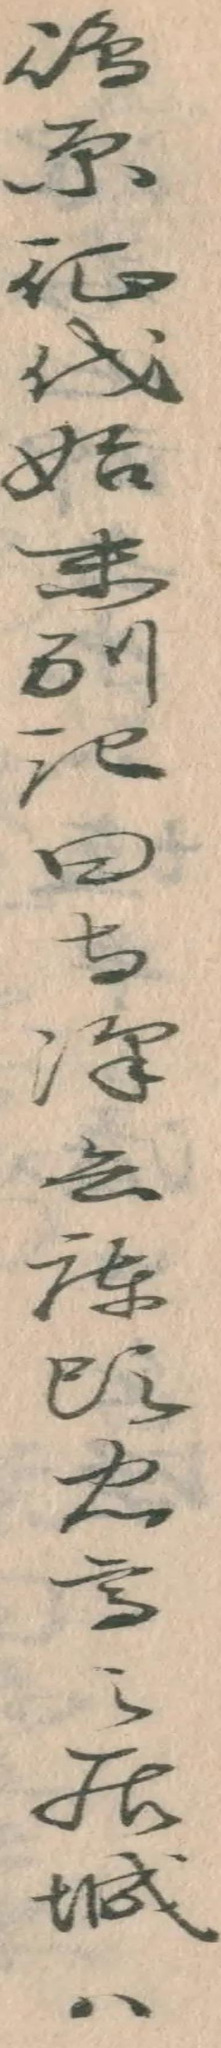島原征伐始末別記曰寺沢兵庫頭忠高之居城は
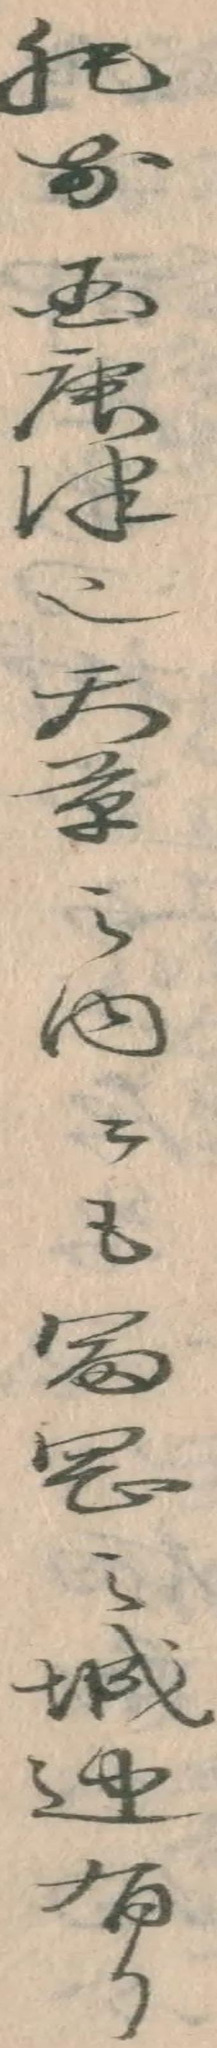肥前国唐津也天草之内にも冨岡之城迚有り
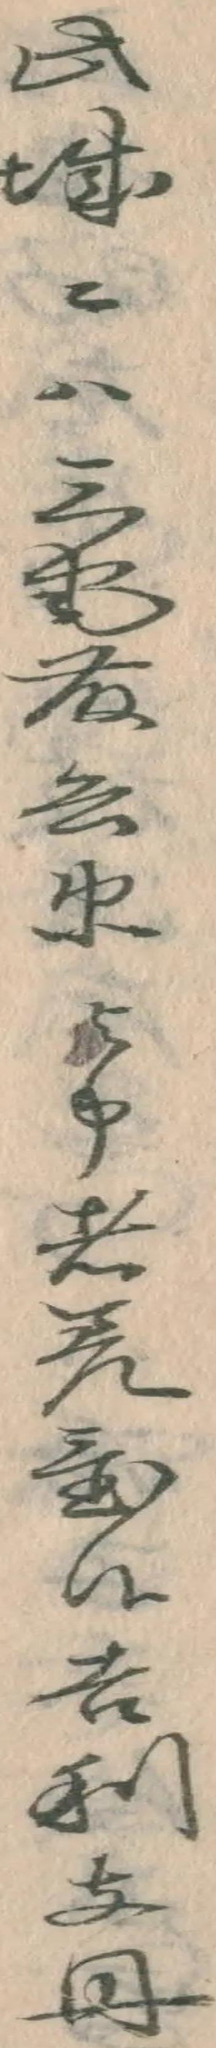此城には三宅藤兵衛と申者差置候吉利支丹
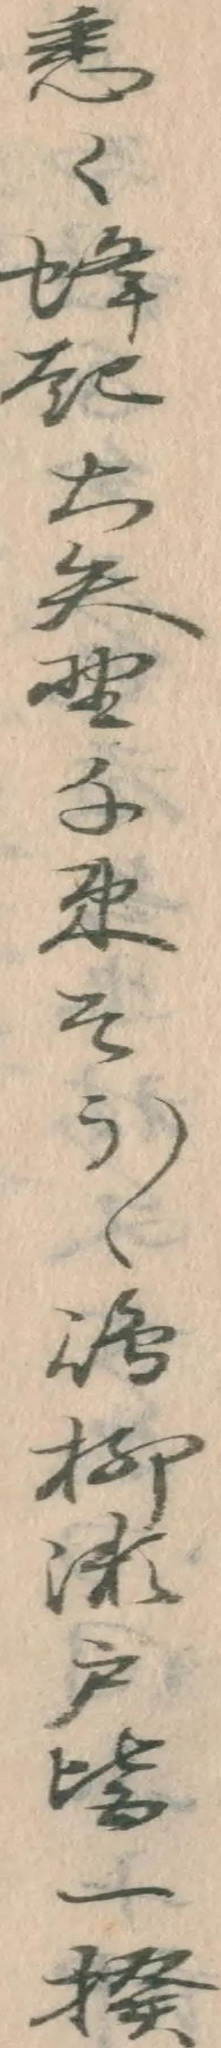悉く蜂起大矢野千束そう〱島柳瀬戸皆一揆
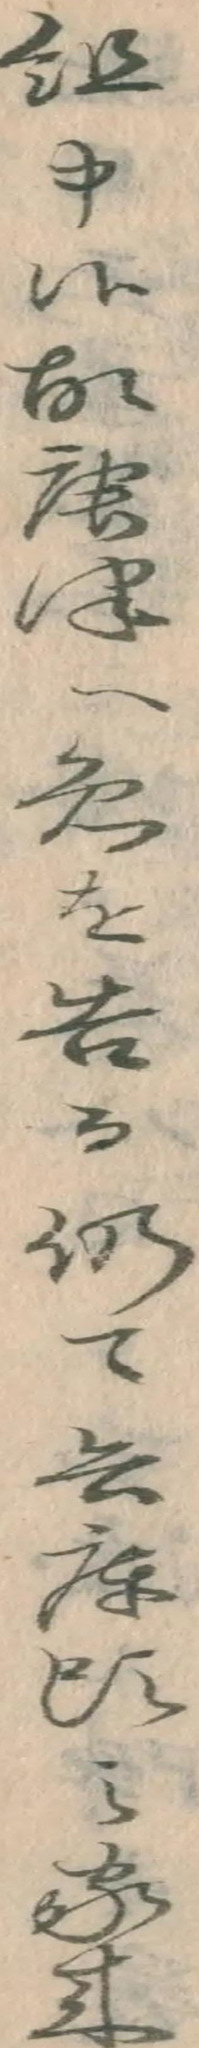組申候故唐津へ免を告る仍て兵庫頭之家来
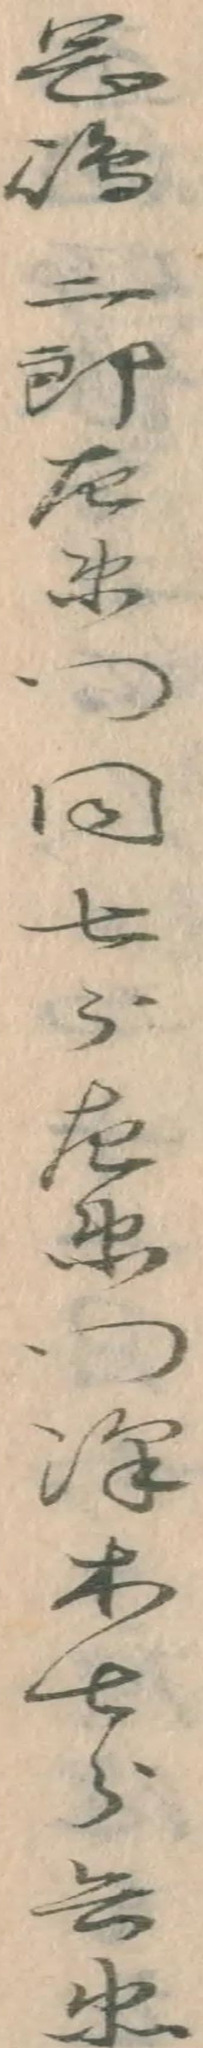岡島二郎左衛門同七郎左衛門沢木七郎兵衛

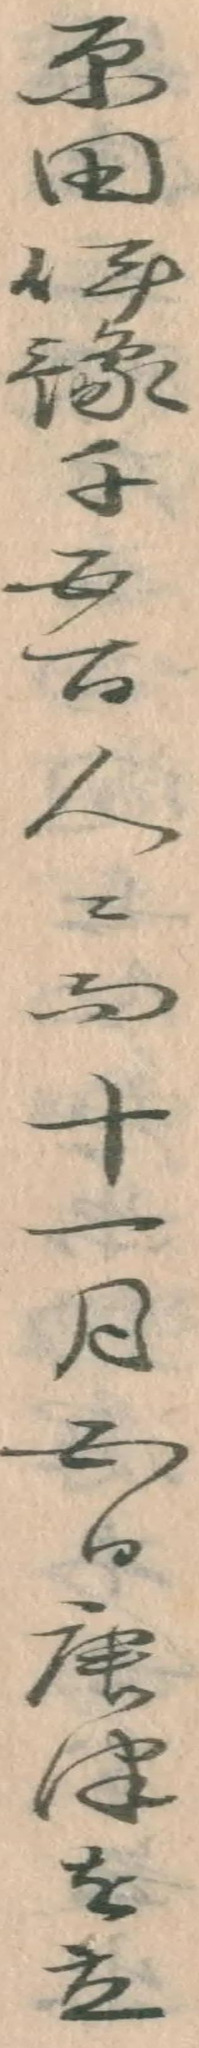原田伊予千五百人に而十一月五日唐津を立
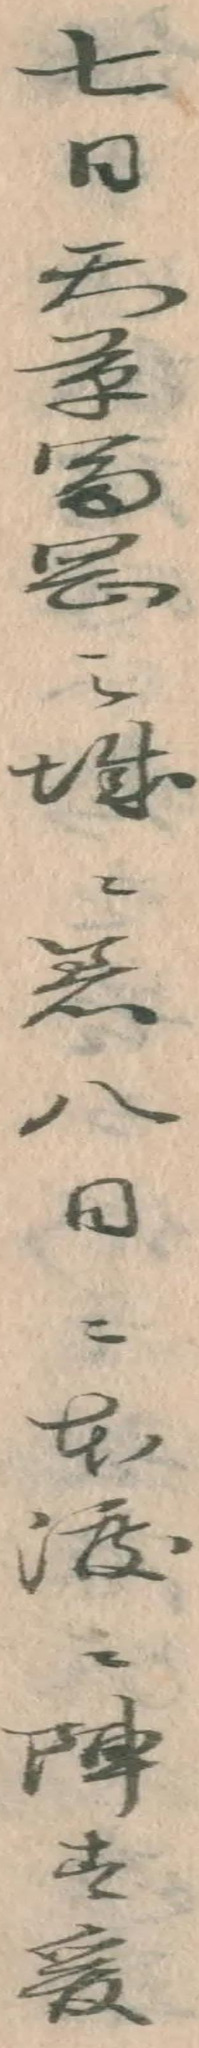七日天草冨岡之城に着八日に本渡に陣春爰
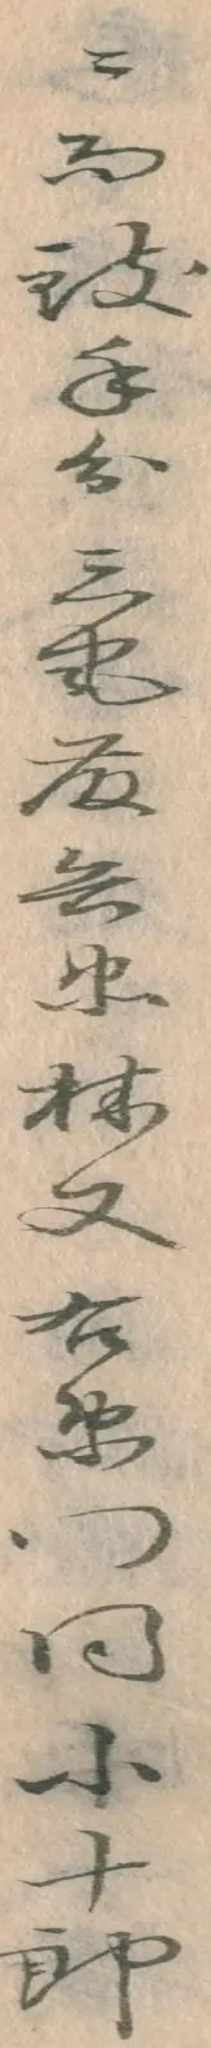に而致手分三宅藤兵衛林又右衛門同小十郎
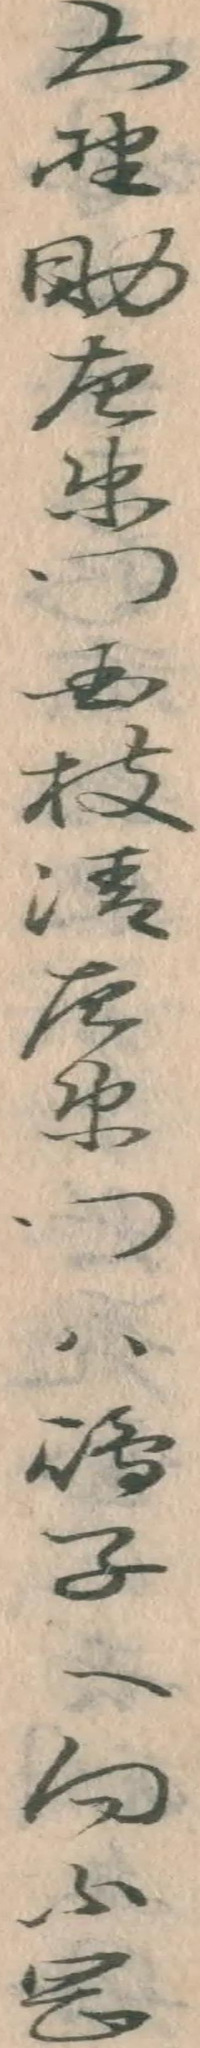大野助左衛門国枝清左衛門は島子へ向ふ岡
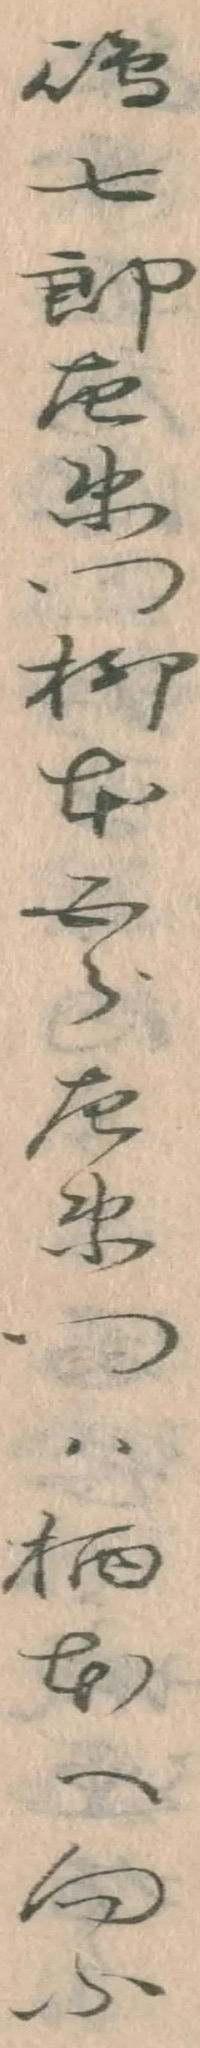島七郎左衛門柳本五郎左衛門は栖本へ向ふ
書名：切支丹御退治記 49巻. [2]
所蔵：国立国会図書館 National Diet Library, JAPAN
